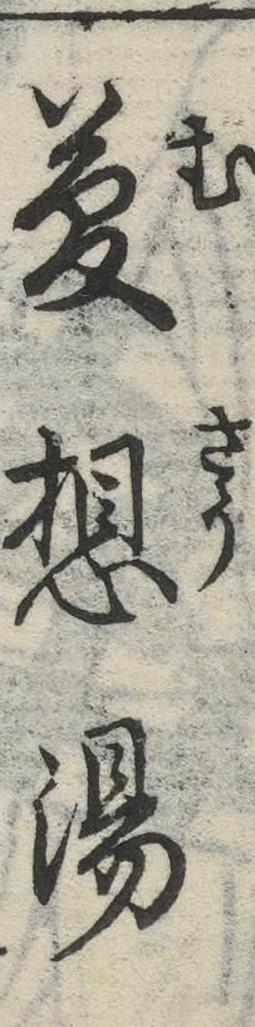夢想湯
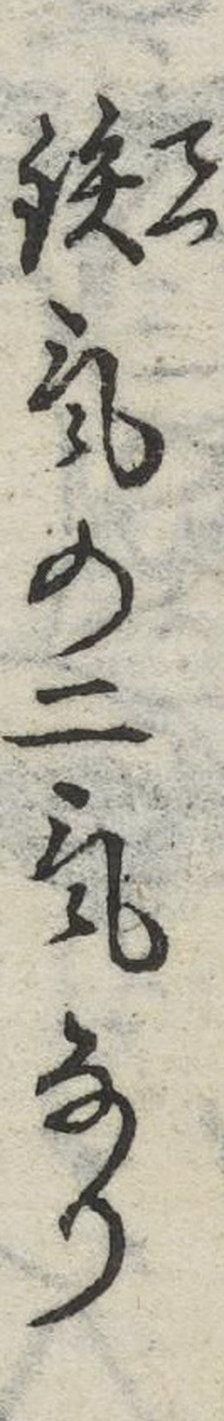鉄気の二気なり
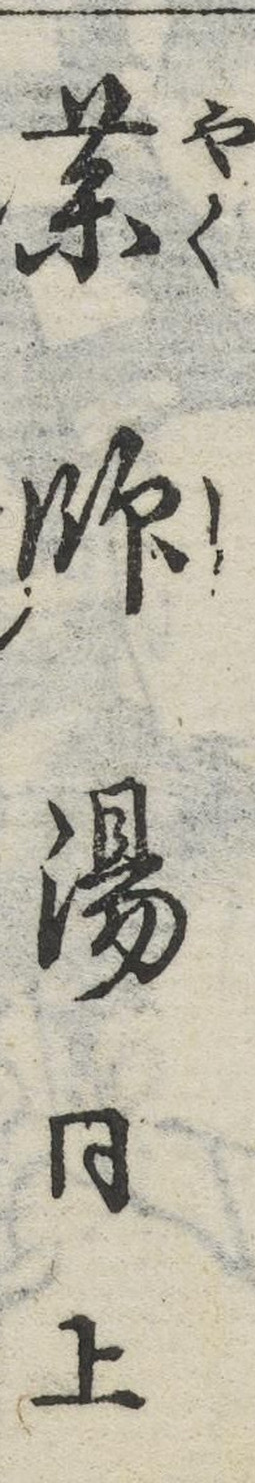薬師湯同上
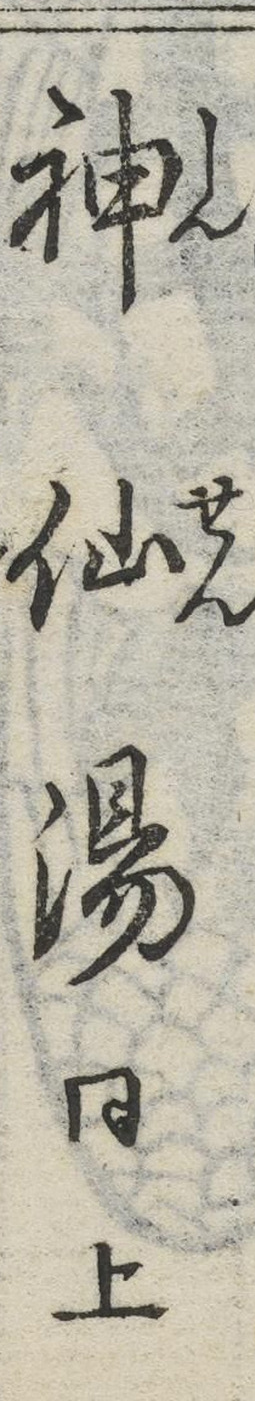神仙湯同上
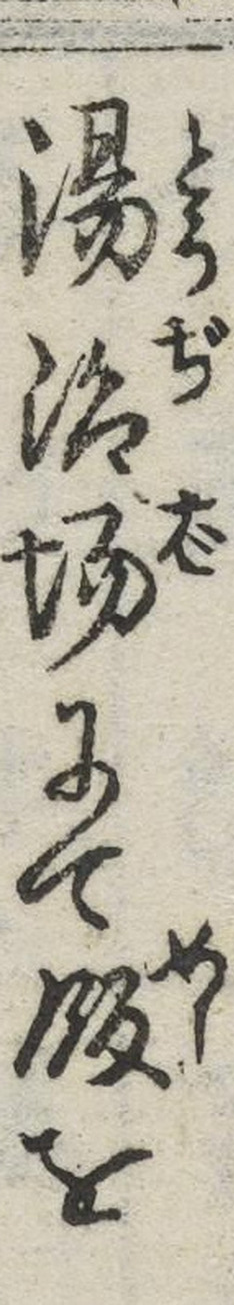湯治場にて飯を
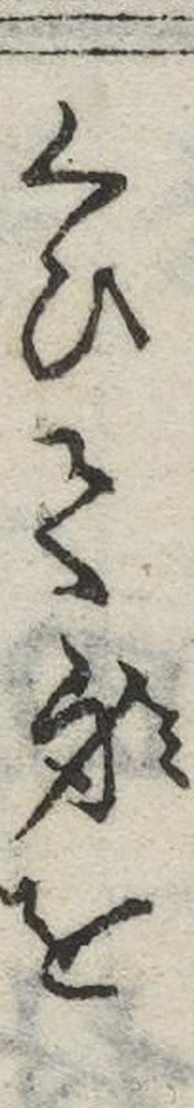くひて身を
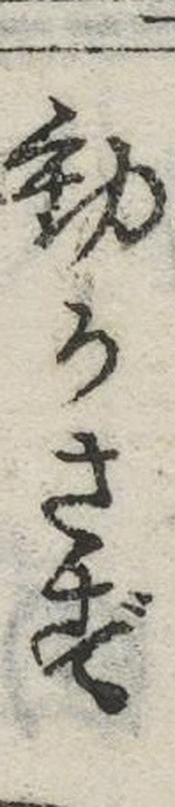動かさず
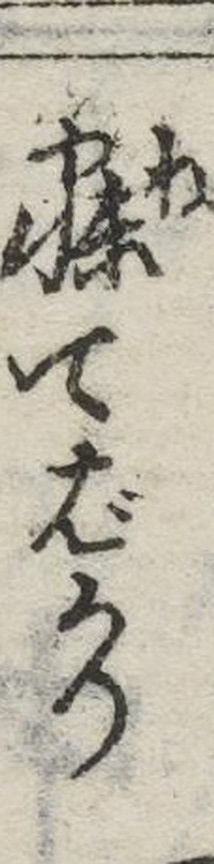寝てばかり
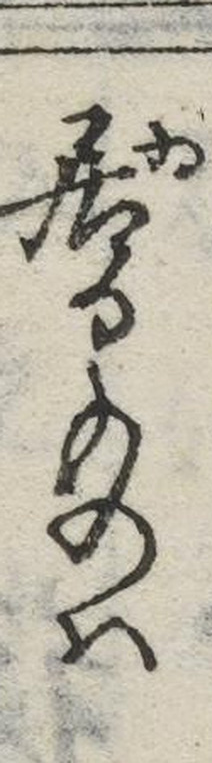居るものは
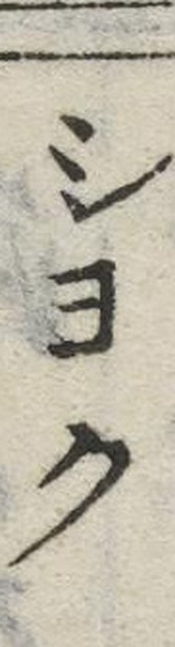シヨク
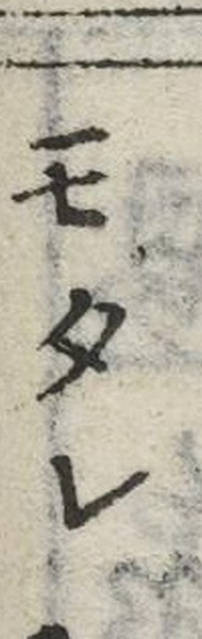モタレ
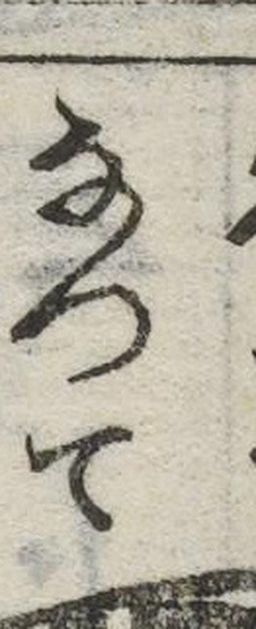なつて
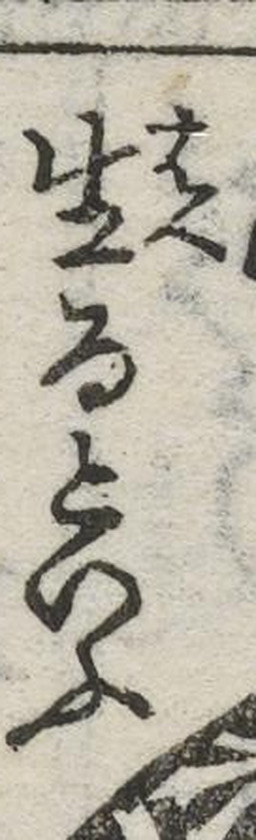生るといふ
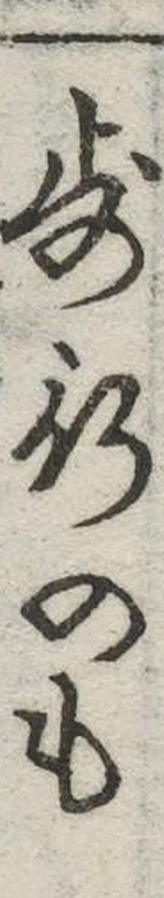歩行のも
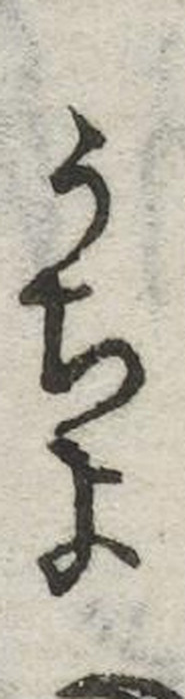うちよ
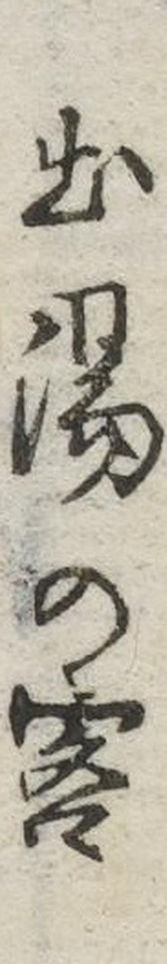出湯の客
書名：諸國温泉遊覽記　全
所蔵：東京大学地震研究所図書室 Earthquake Research Institute Library, The University of Tokyo, JAPAN
